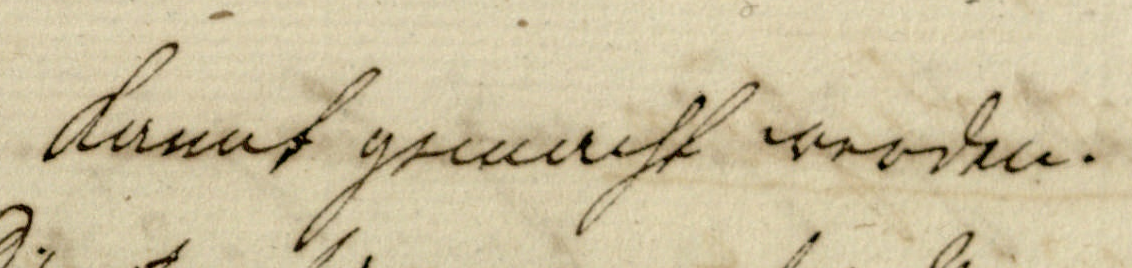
kannt gemacht werden.
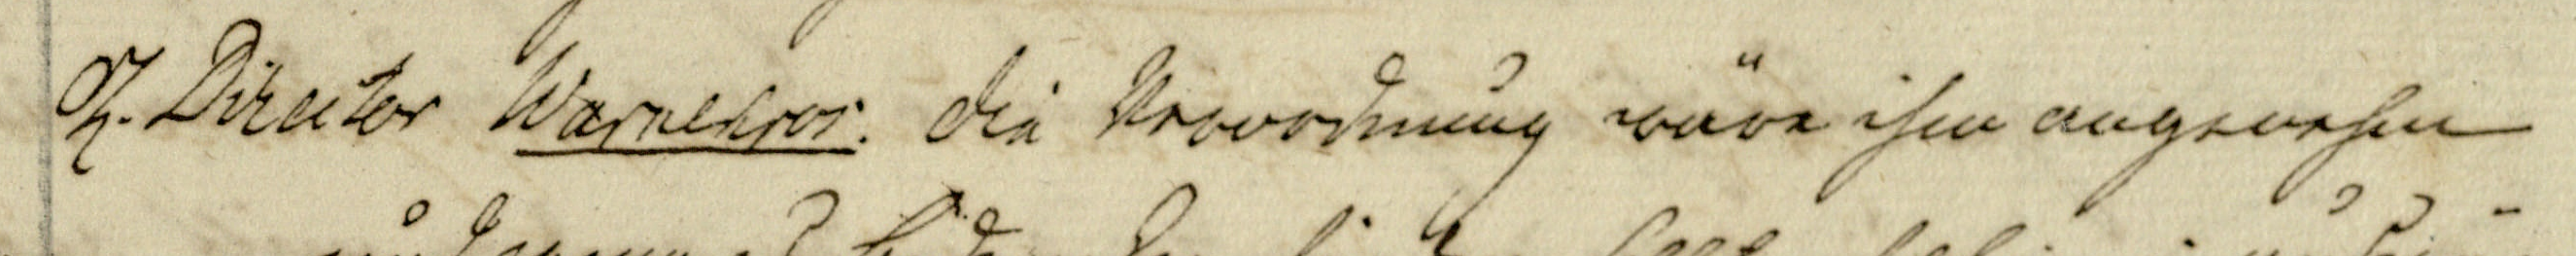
dh. Director Warnekros. Die Verordnung wäre ihm angenehm
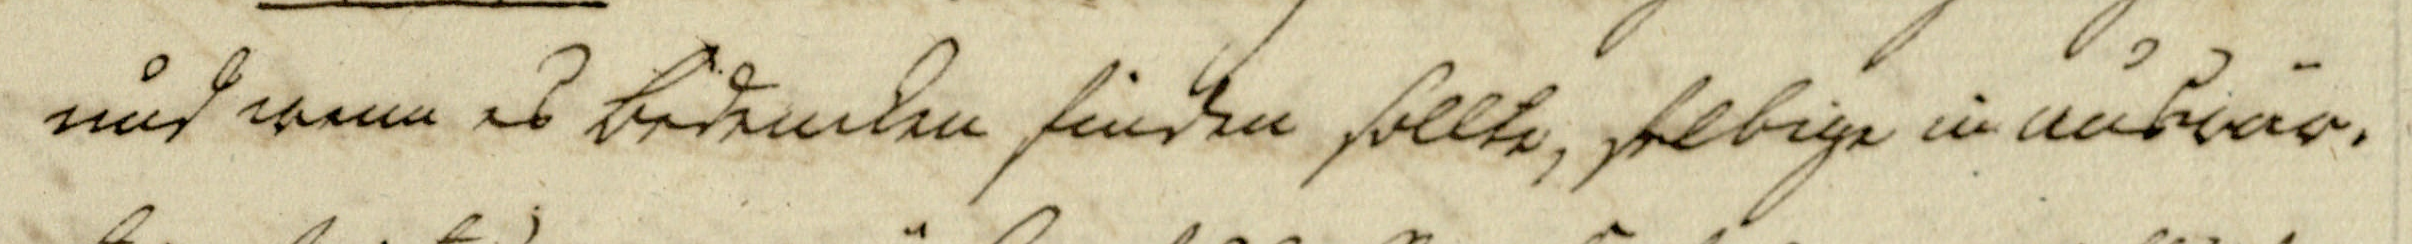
und wenn es Bedencken finden sollte, selbige in auswär¬
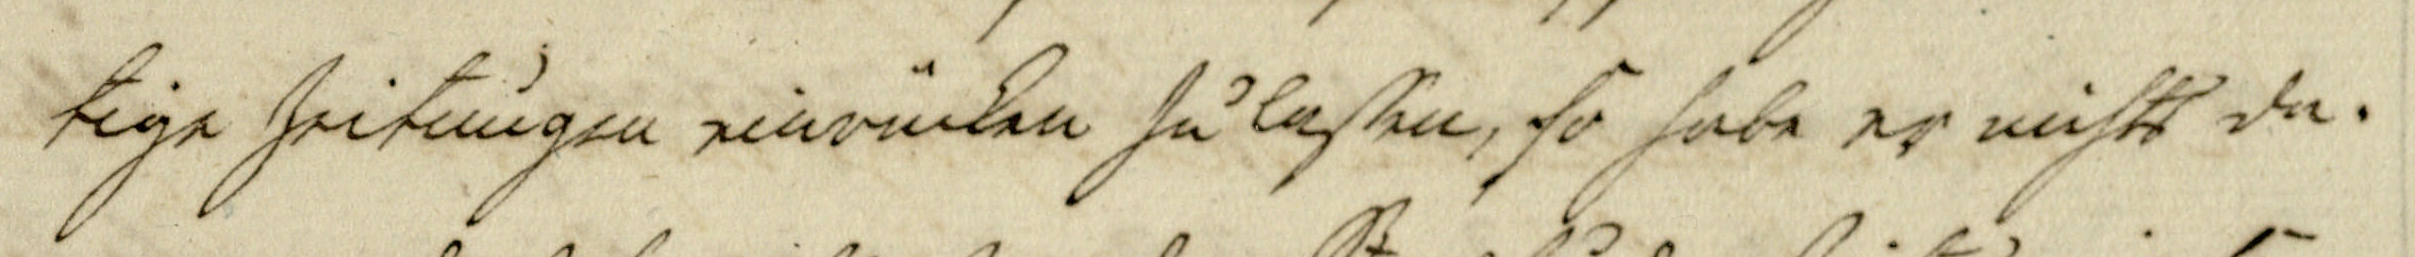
tige Zeitungen einrücken zu lassen, so habe er nichts da¬
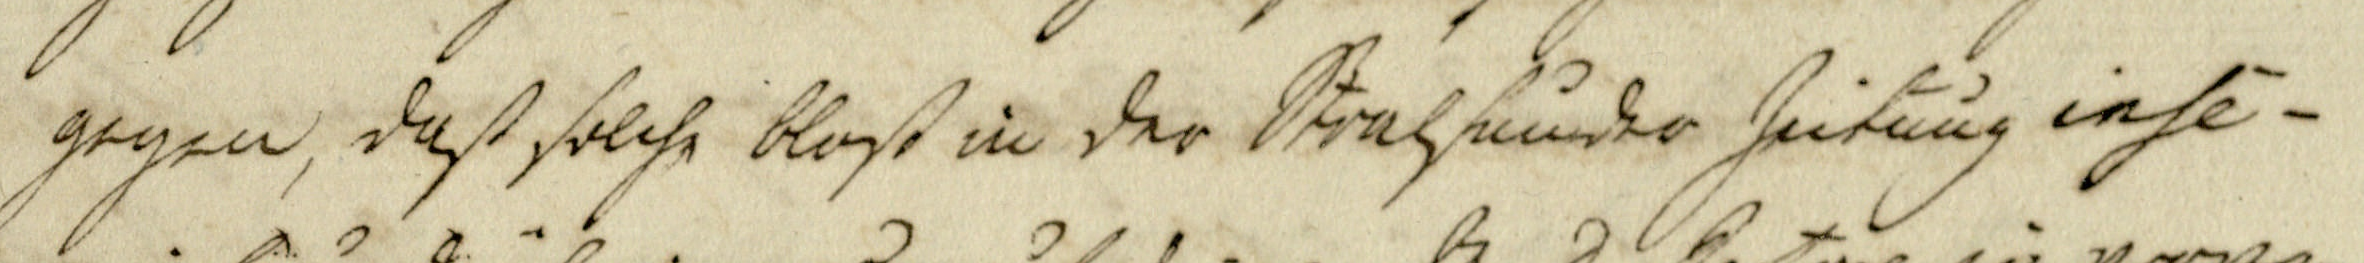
gegen, daß solche bloß in der Stralsunder Zeitungg inse¬
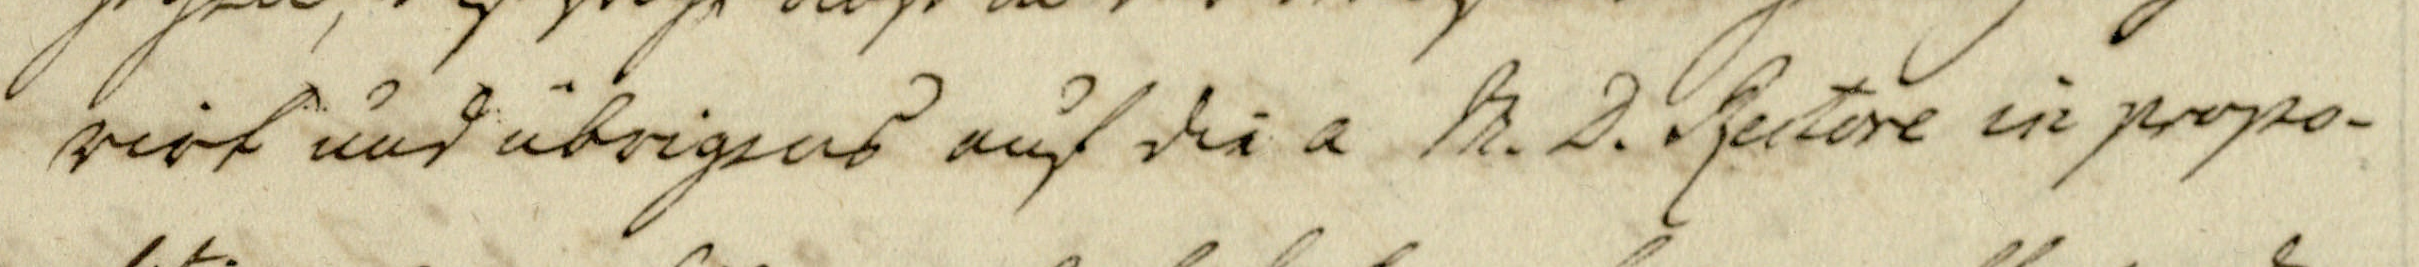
rirt und übrigens auf die a M. D. Rectore in propo¬
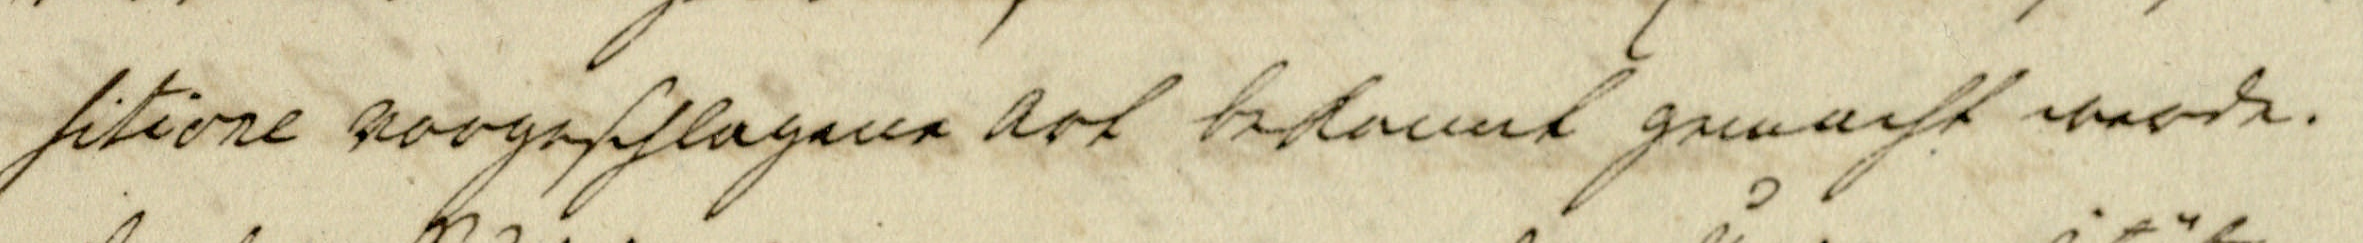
sitione vorgeschlagene Art bekannt gemacht werde.
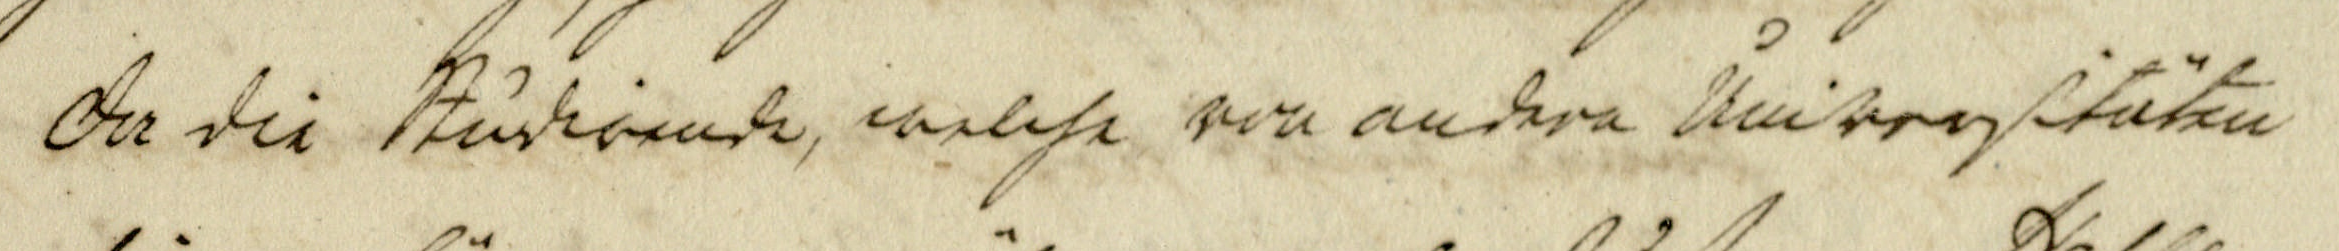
Da die Studirende, welche von andern Universitäten
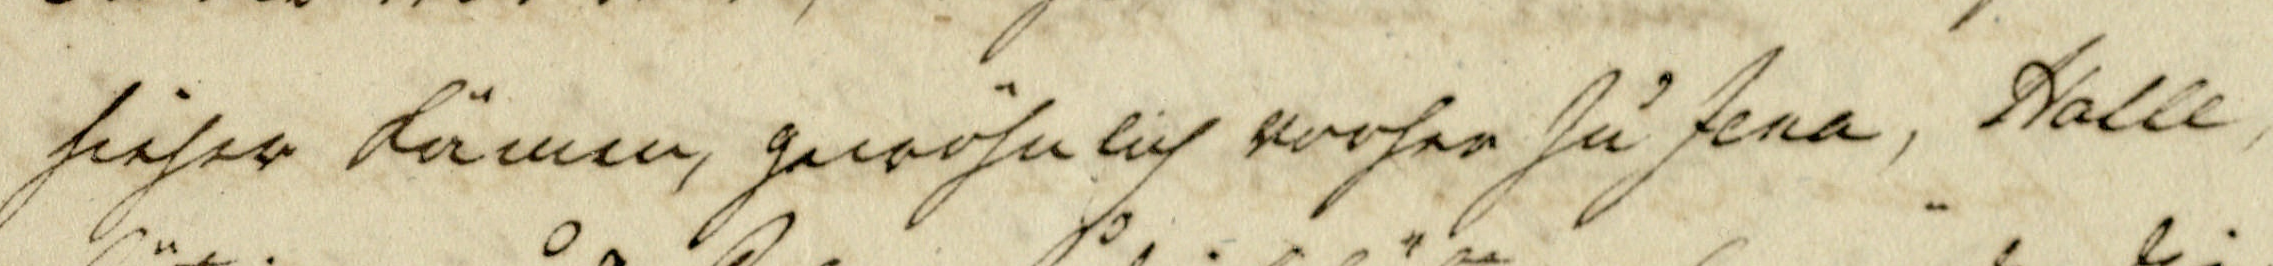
hieher kämen, gewöhnlich vorher zu Jena, Halle,
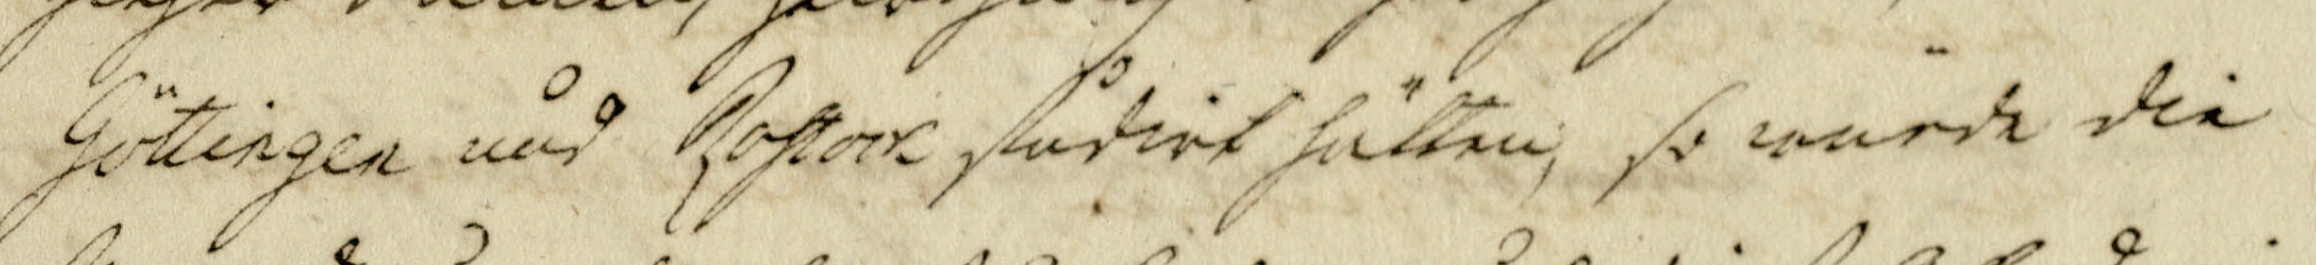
Göttingen und Rostock sudirt hätten, so würde die
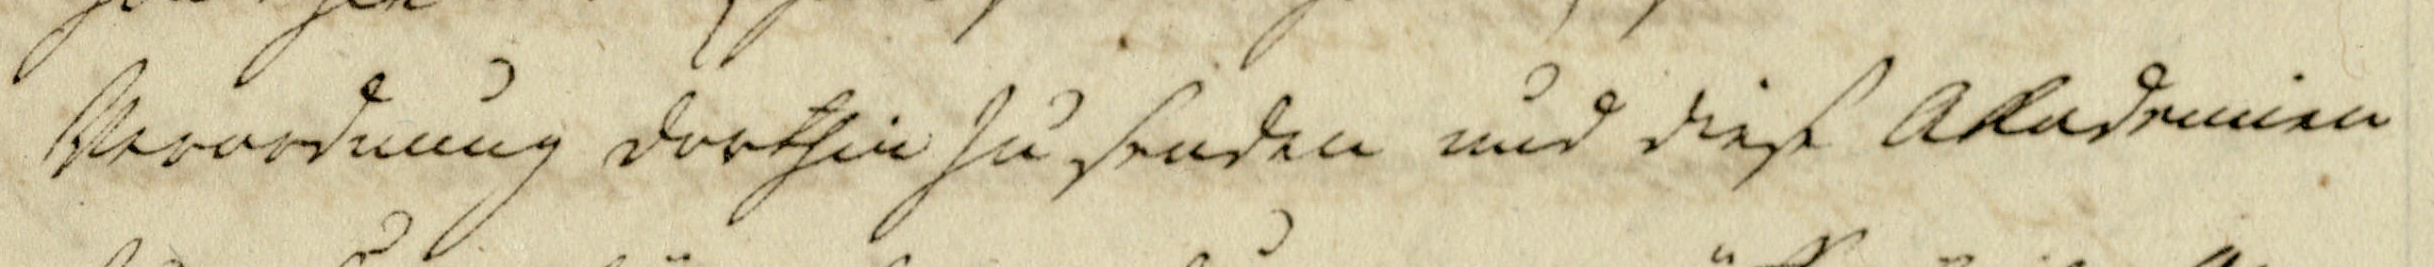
Verordnung dorthin zu senden und diese Akademien
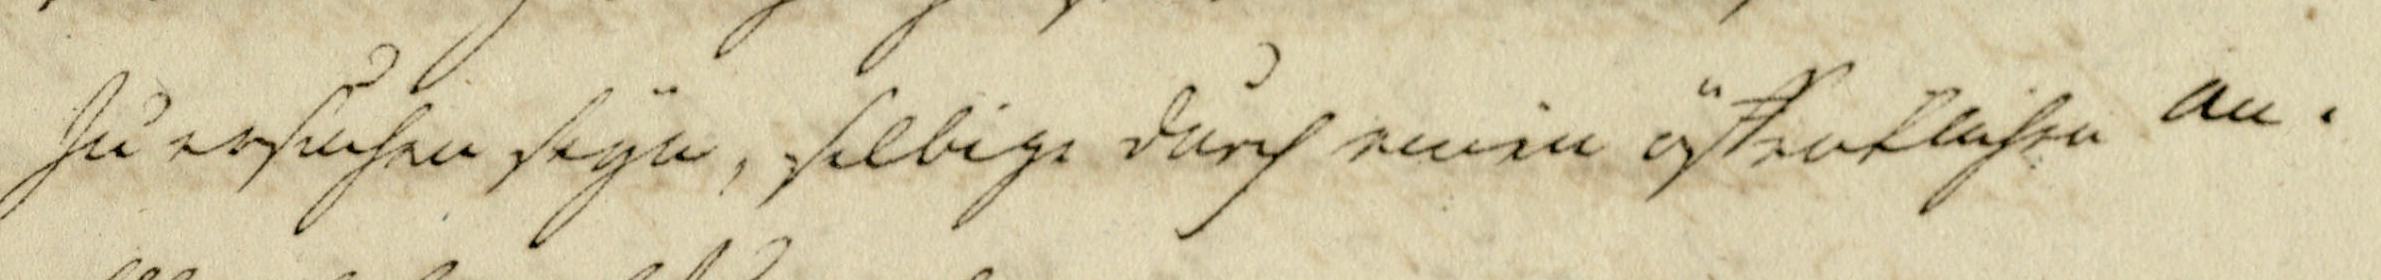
zu ersuchen seÿn, selbige durch einen öffentlichen An¬
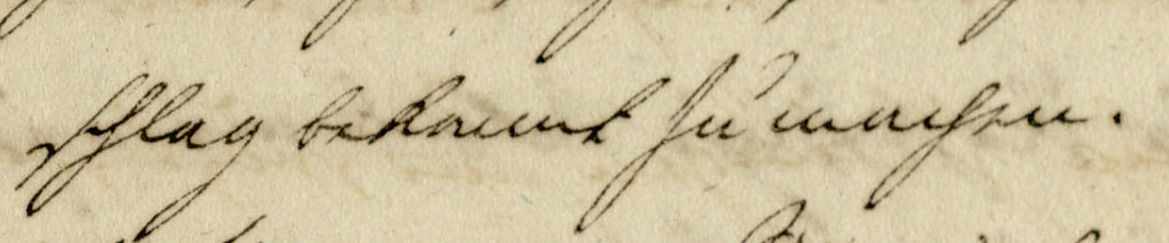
schlag bekannt zu machen.
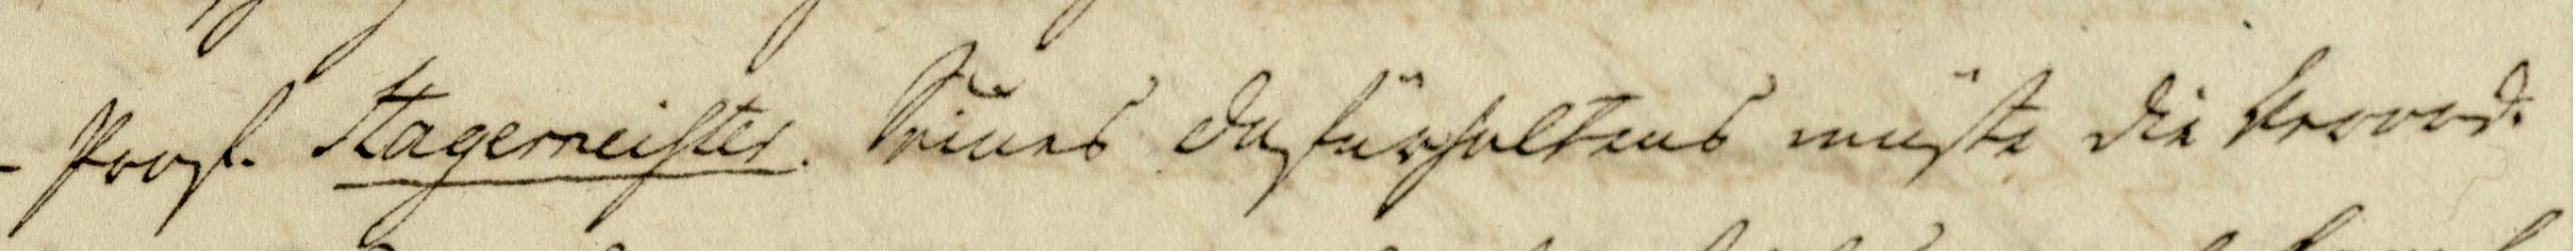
Prof. Hagemeister, Seines Dafürhaltens müßte die Verord¬
